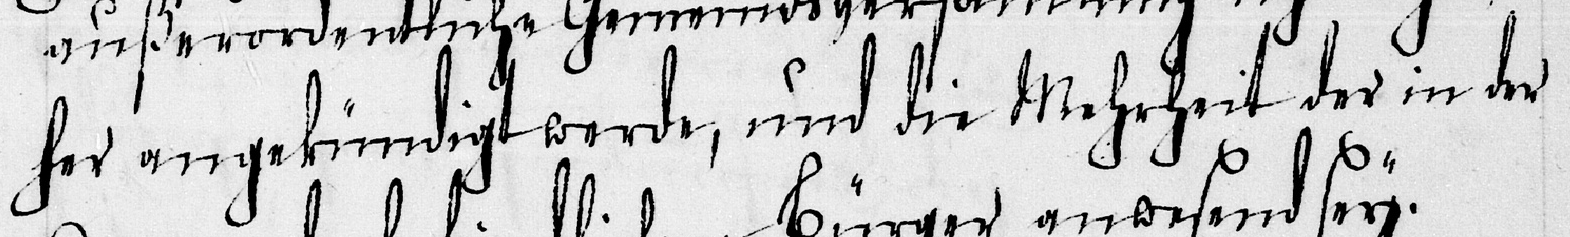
her angekündigt werde, und die Mehrheit der in der
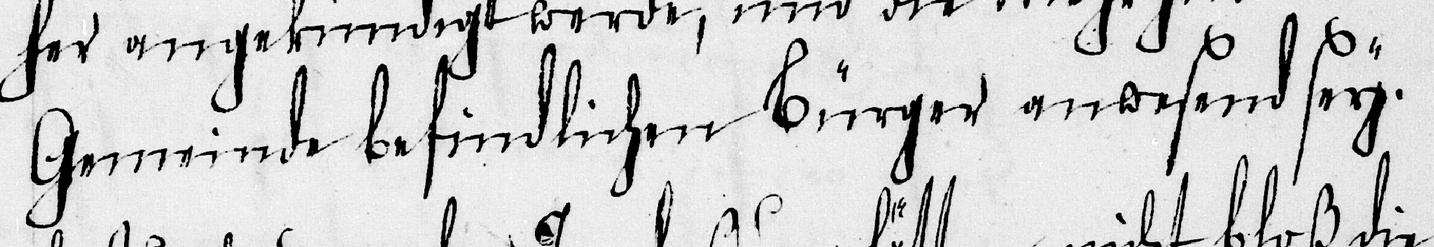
Gemeinde befindlichen Bürger anwesend sey.
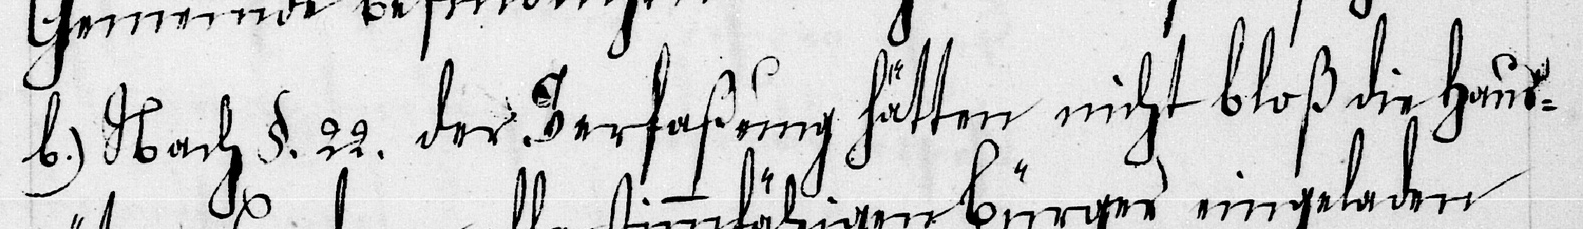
b.) Nach §. 22. der Verfaßung hätten nicht bloß die Haus¬
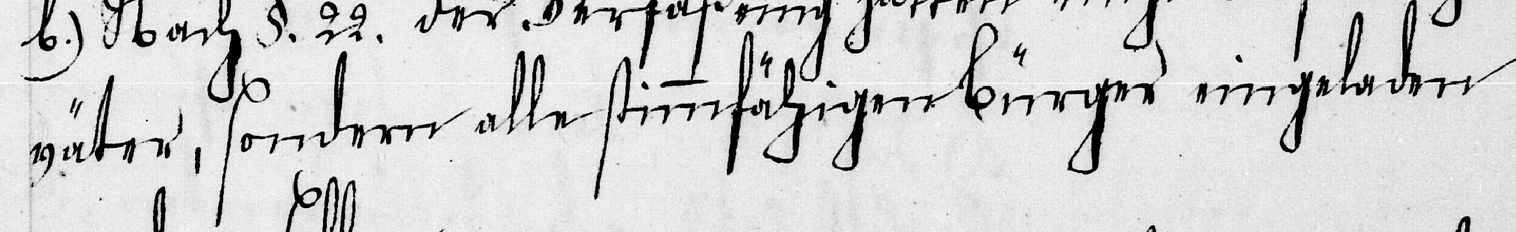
väter, sondern alle stimmfähigen Bürger eingeladen
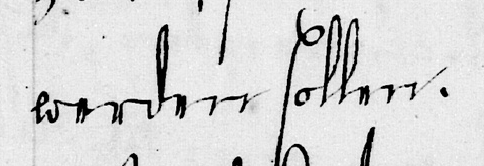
werden sollen.
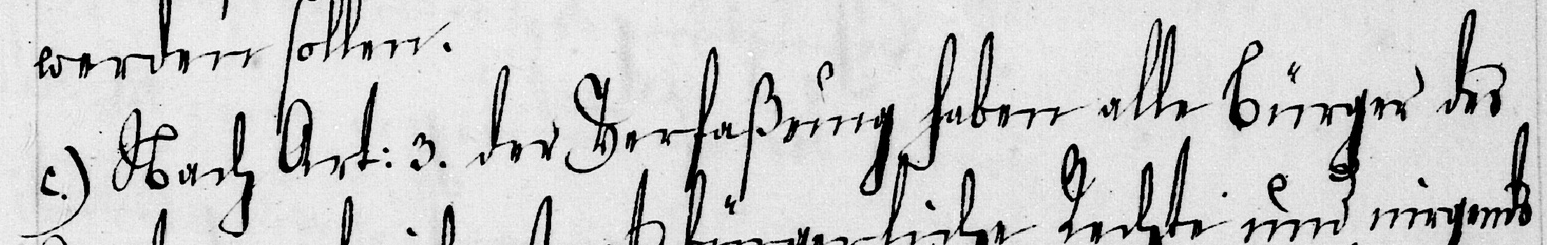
c.) Nach Art: 3. der Verfaßung haben alle Bürger des
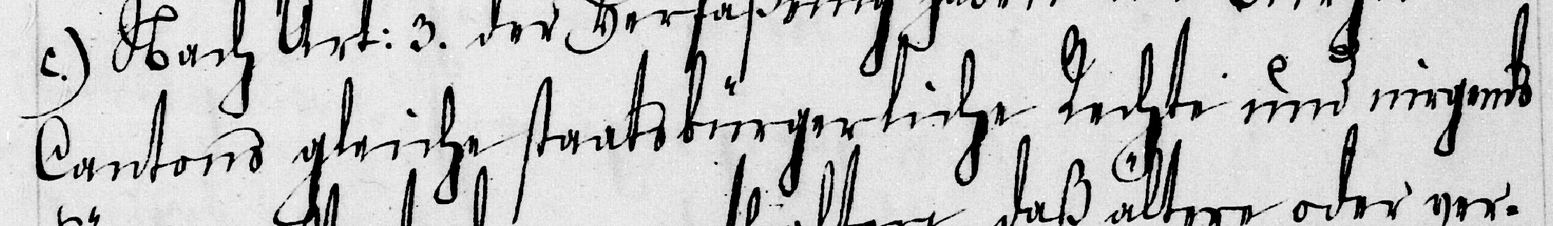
Cantons gleiche staatsbürgerliche Rechte und nirgends
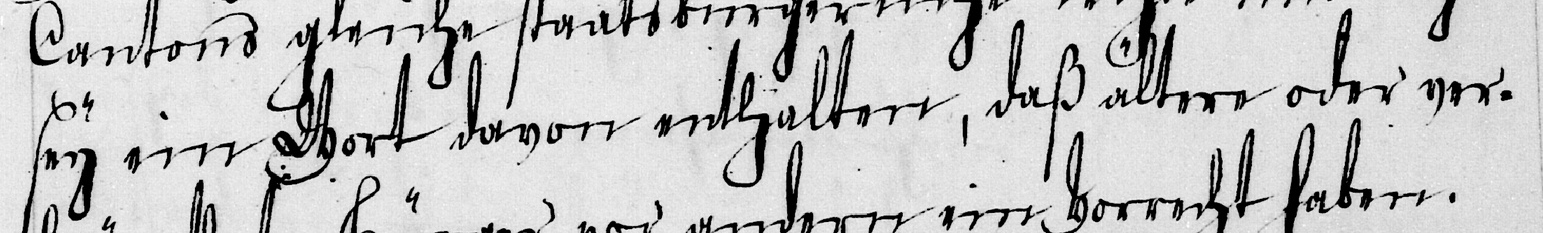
sey ein Wort davon enthalten, daß ältere oder ver¬
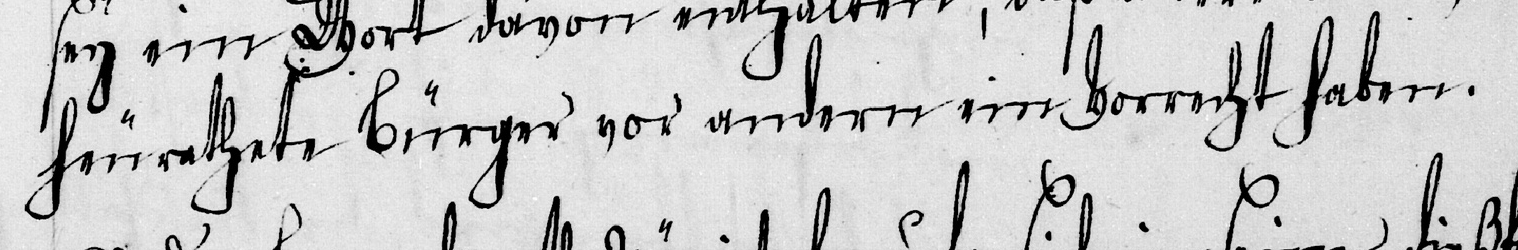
heurathete Bürger vor andern ein Vorrecht haben.
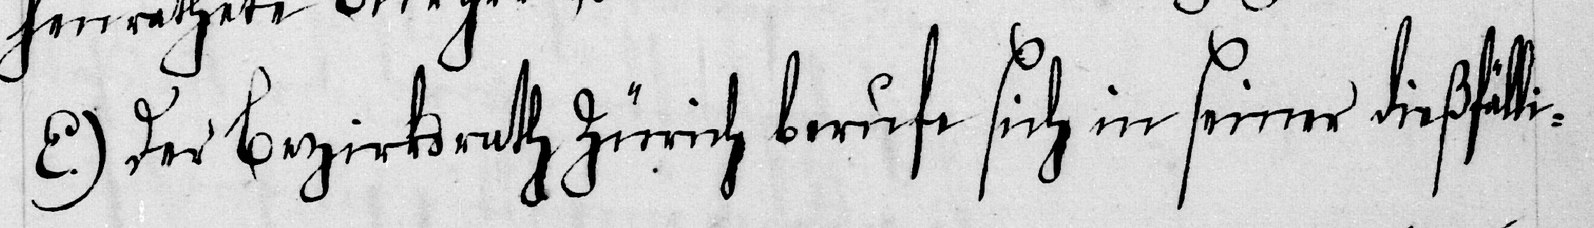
E.) Der Bezirksrath Zürich berufe sich in seiner dießfäl¬
